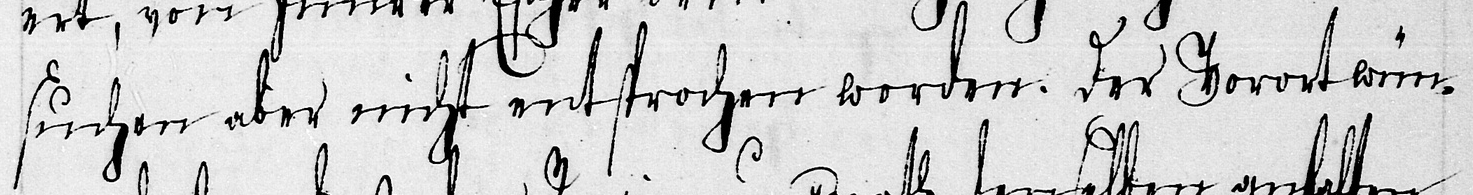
suchen aber nicht entsprochen worden. Der Vorort wün¬
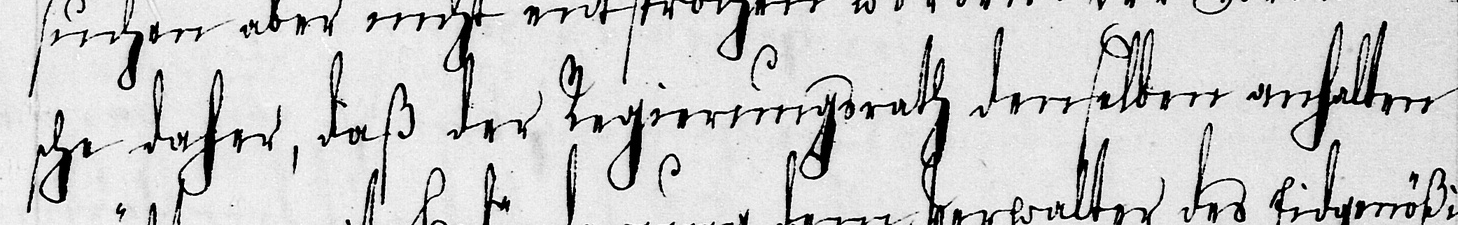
sche daher, daß der Regierungsrath denselben anhalten
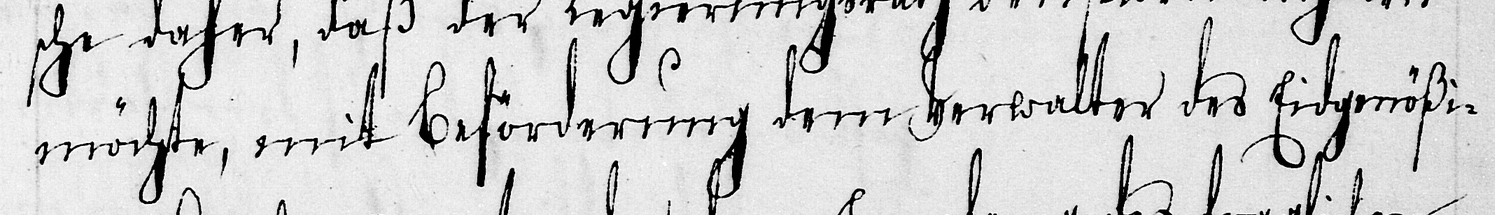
möchte, mit Beförderung dem Verwalter des Eidgenößi¬
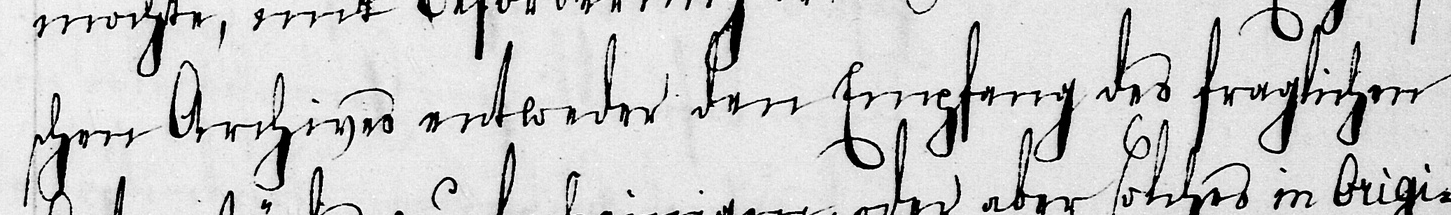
schen Archives entweder den Empfang des fraglichen
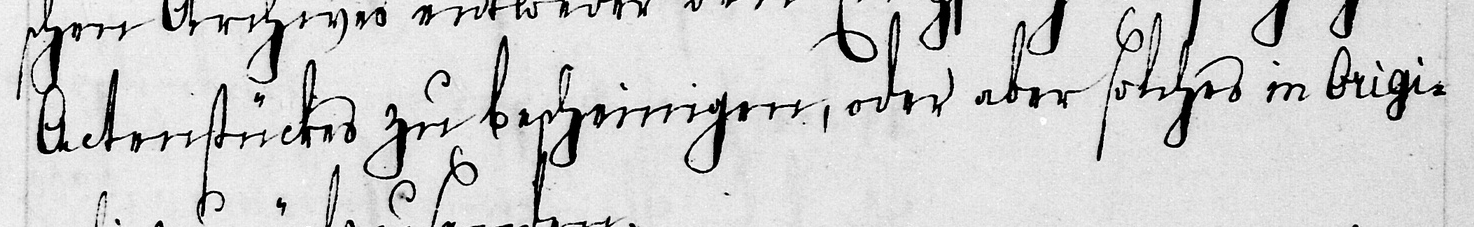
Actenstückes zu bescheinigen, oder aber solches in Origi¬
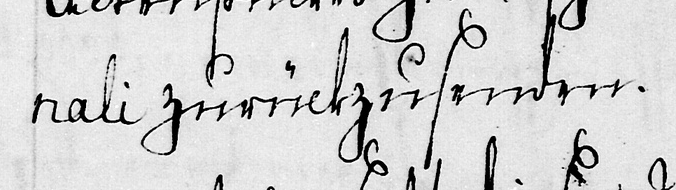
nali zurückzusenden.
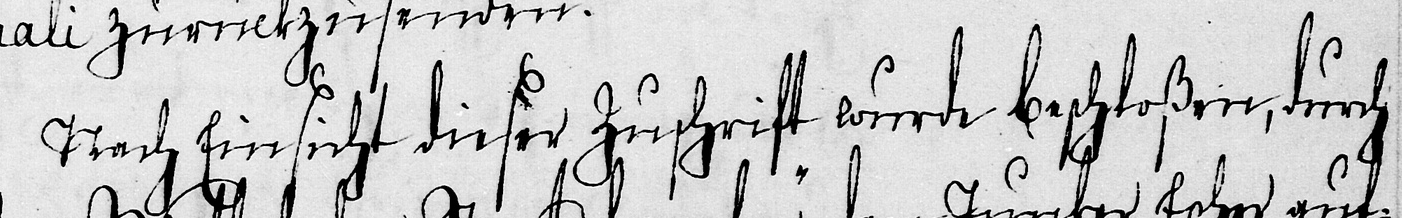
Nach Einsicht dieser Zuschrift wurde beschloßen, durch
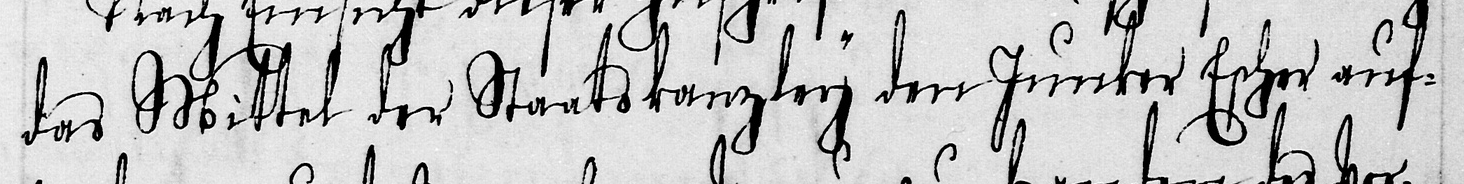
das Mittel der Staatskanzley den Junker Escher auf¬
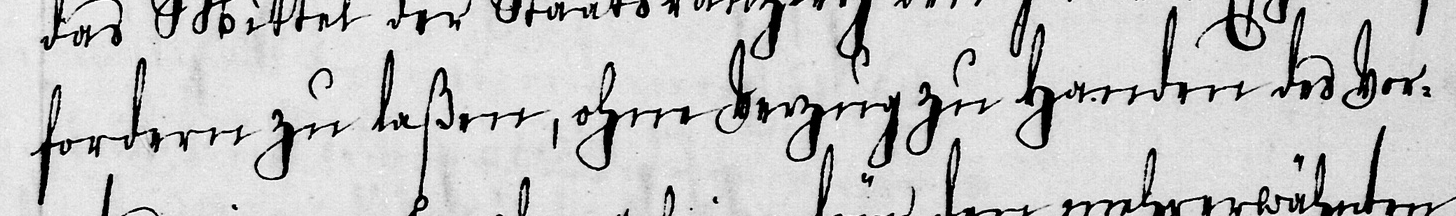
fordern zu laßen, ohne Verzug zu Handen des Vor¬
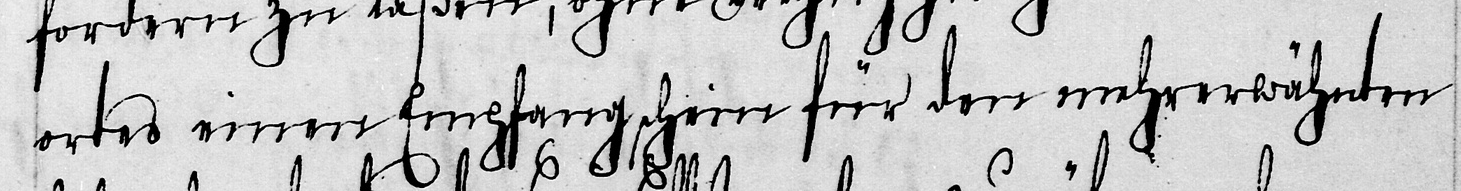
ortes einen Empfangschein für den mehrerwähnten
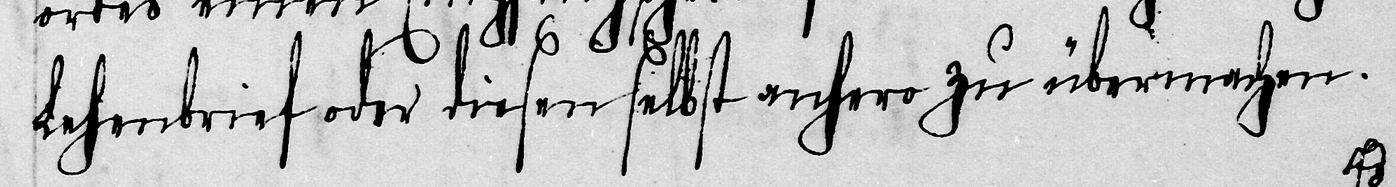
Lehenbrief oder diesen selbst anhero zu übermachen.
